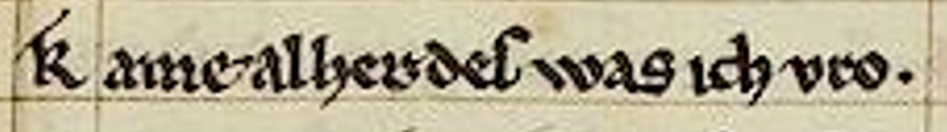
Kame alherdeſ was ich vro.
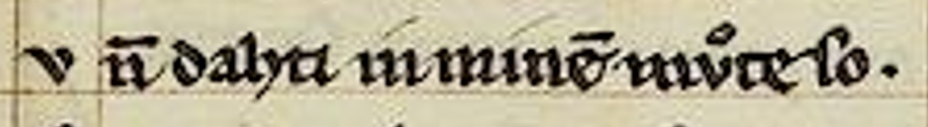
Vn(d) dahti in mine(m) mv°ote ſo.
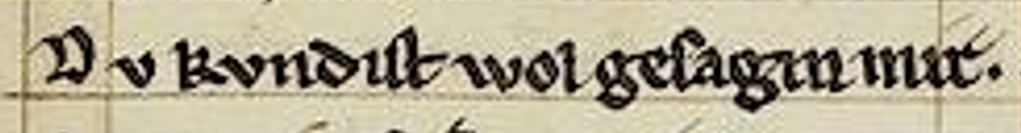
Dv kvndiſt wol geſagin mir.
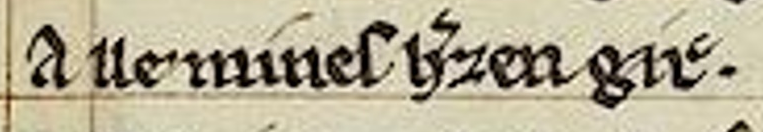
Alle mineſ h(er)zen gir.
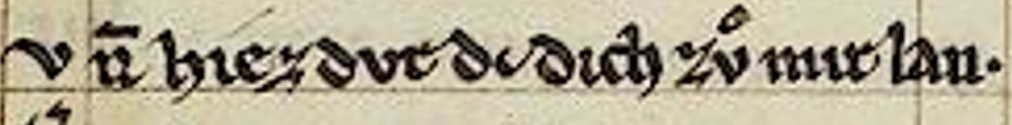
Vn(d) hiez dvr d(az) dich zv°o mir lan.
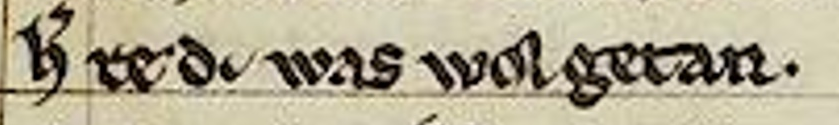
H(er)re d(az) was wol getan.
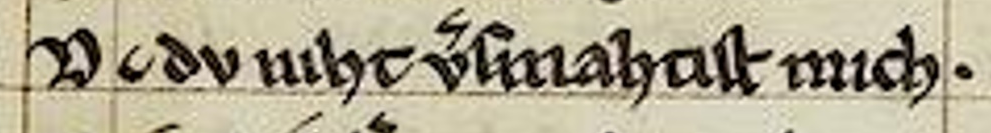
D(az) dv niht v(er)ſmahtiſt mich.
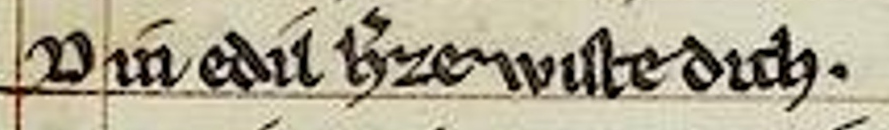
Din edil h(er)ze wiſte dich.
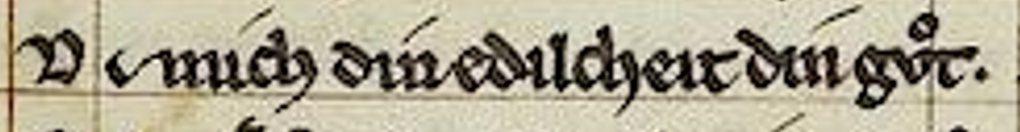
D(az) mich din edilcheit din gv°ot.
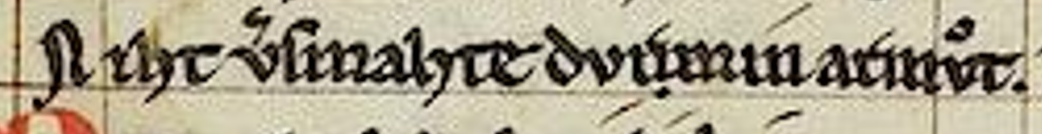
Niht v(er)ſmahte dvr?min armv°ot.
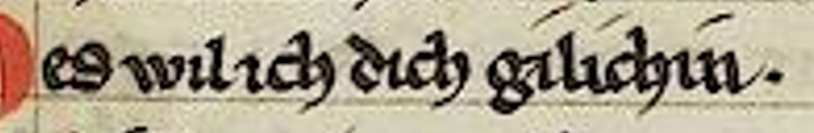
*Des wil ich dich gilichin.
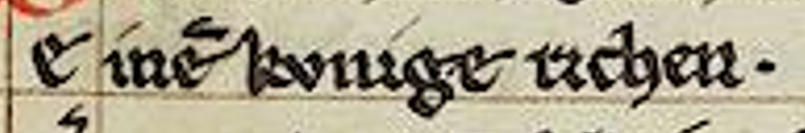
Eine(m) kvnige richen.
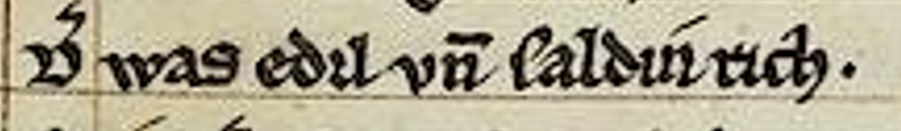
D(er) was edil vn(d) ſaldin rich.
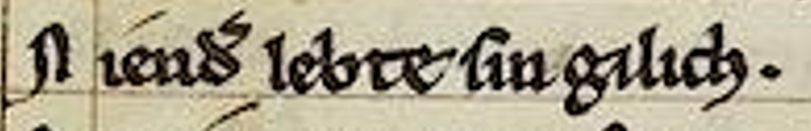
Niend(er) lebte ſin gilich.
